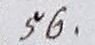56.
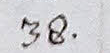38.
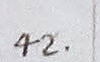42.
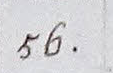56.
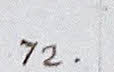72.
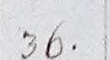36.
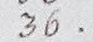36
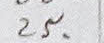25.
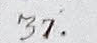37.
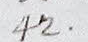42
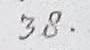38
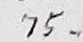75
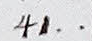41.
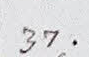37
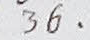36
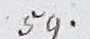59
